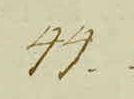44.
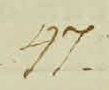47
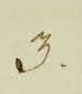3
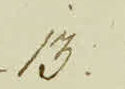13.
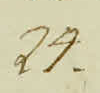24
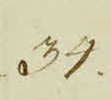34
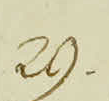29
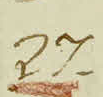27
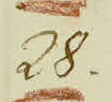28
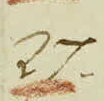27
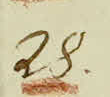28
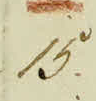15
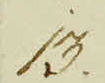13
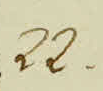22
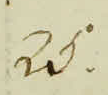25
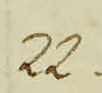22
